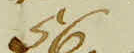56.
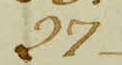27
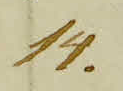14.
